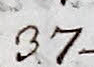37
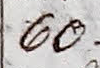60
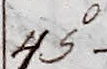45
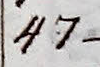47
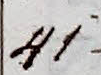41
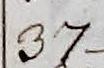37
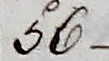56
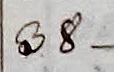38
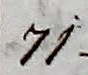71
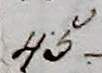45
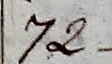72
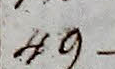49
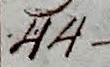44
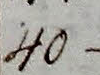40
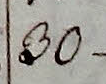30
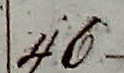46
